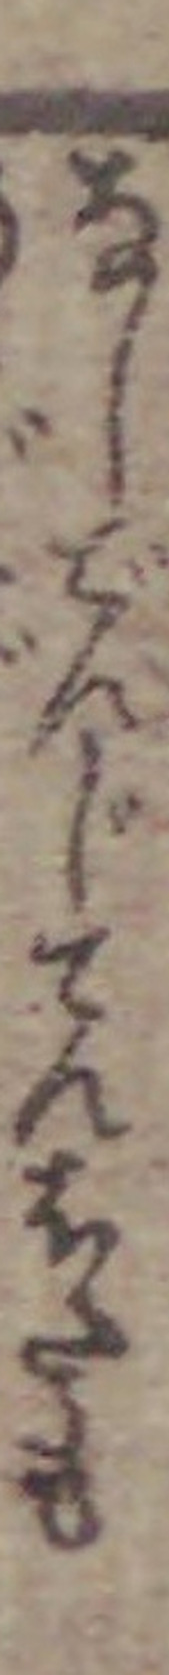なしでんじてんはたも
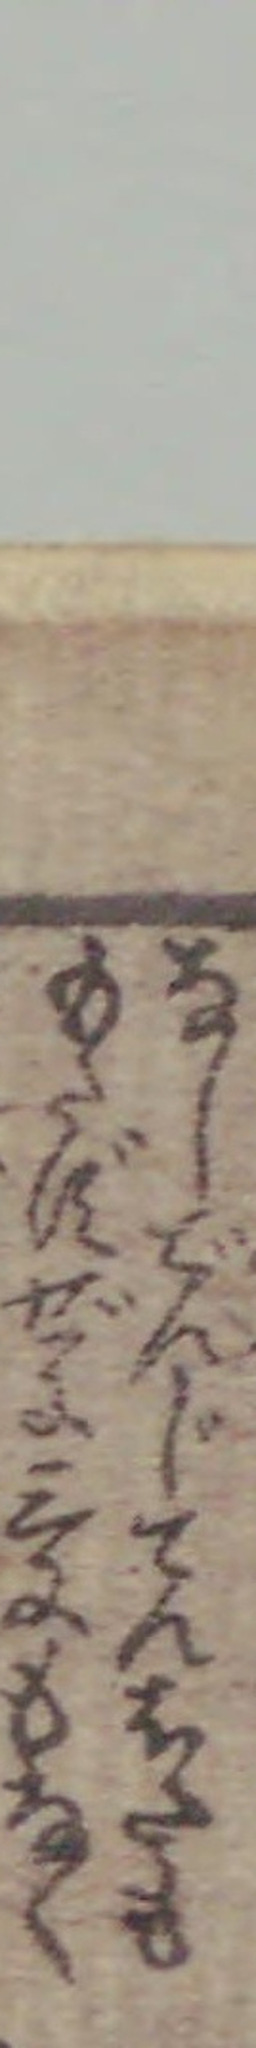もたずぜに三文もなく
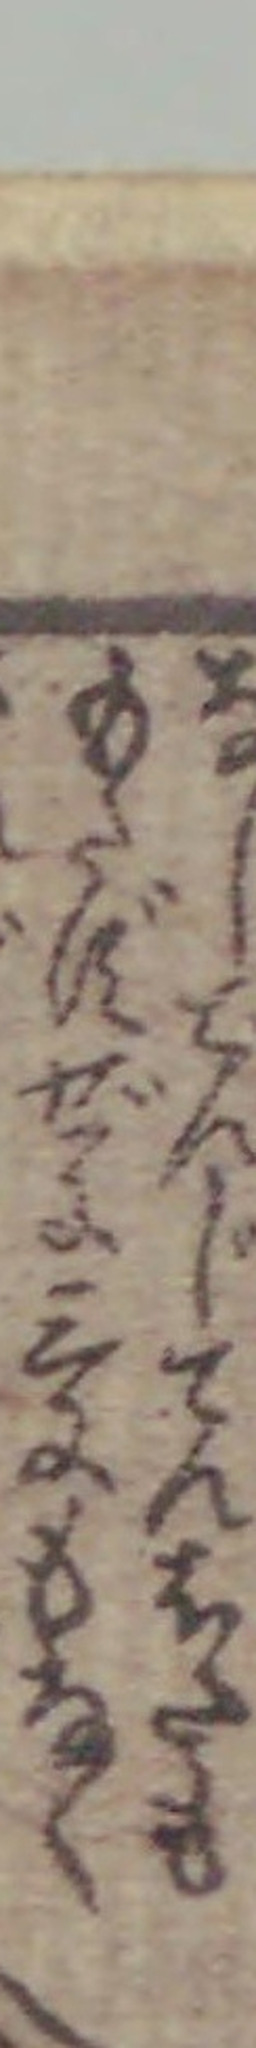もたずぜに三文もなく
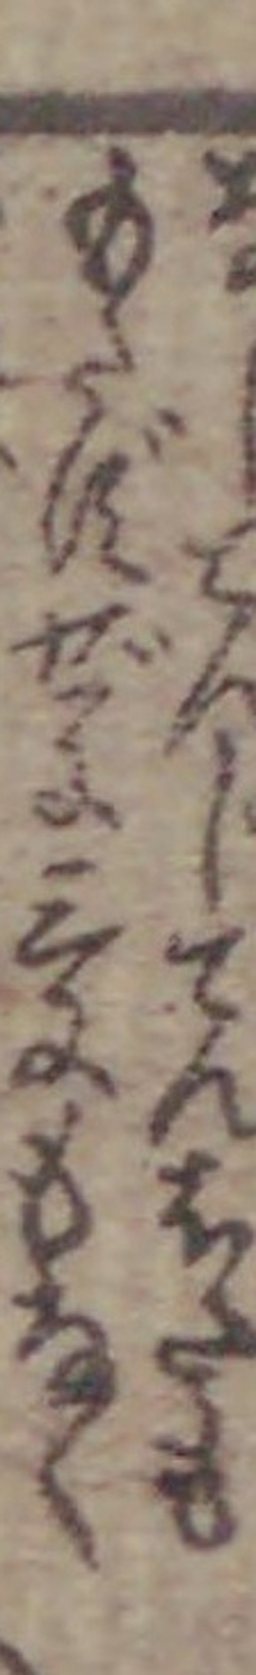もたずぜに三文もなく
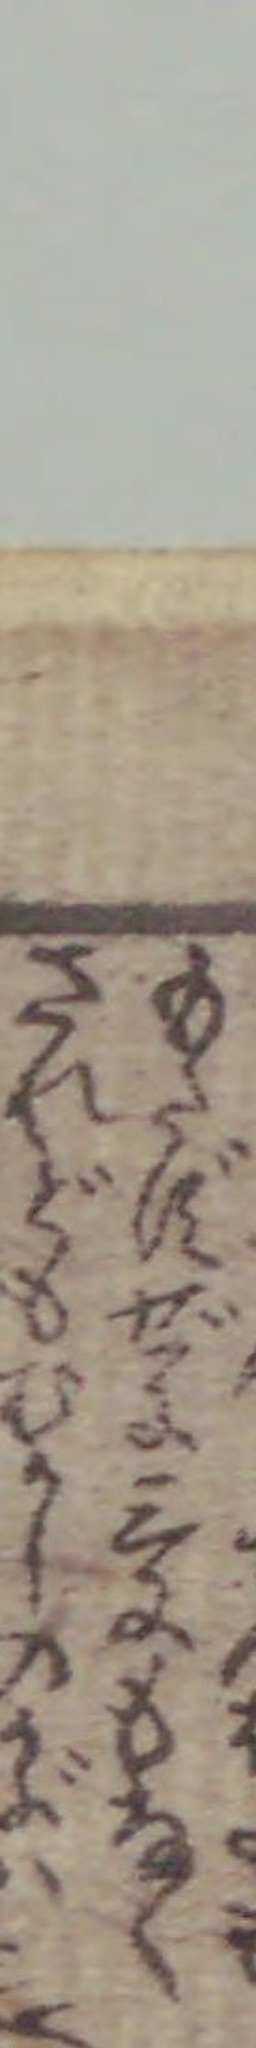されどもむかしのかぶは
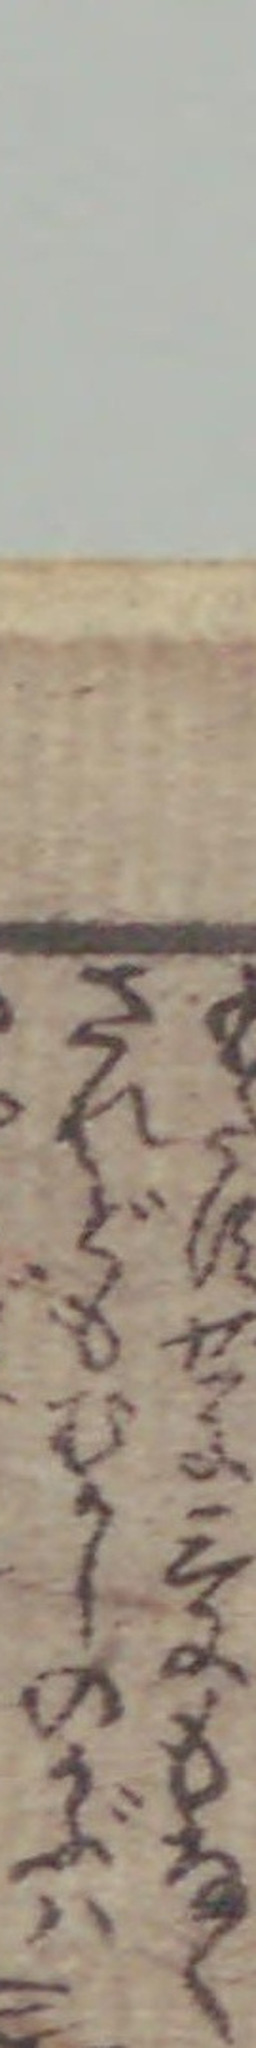されどもむかしのかぶは
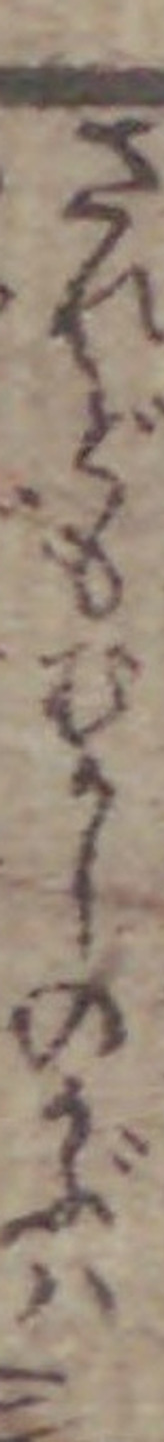されどもむかしのかぶは
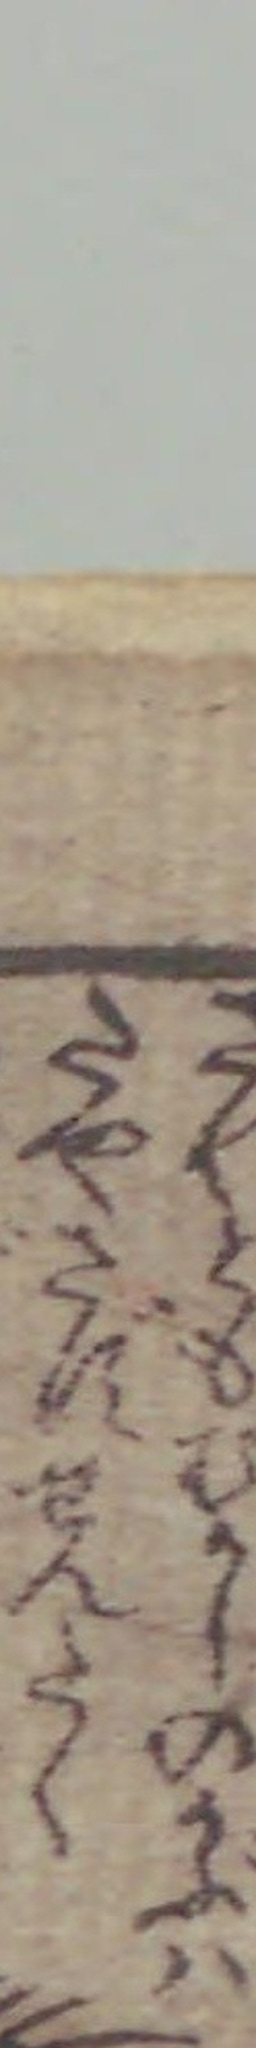たやさずせんたく
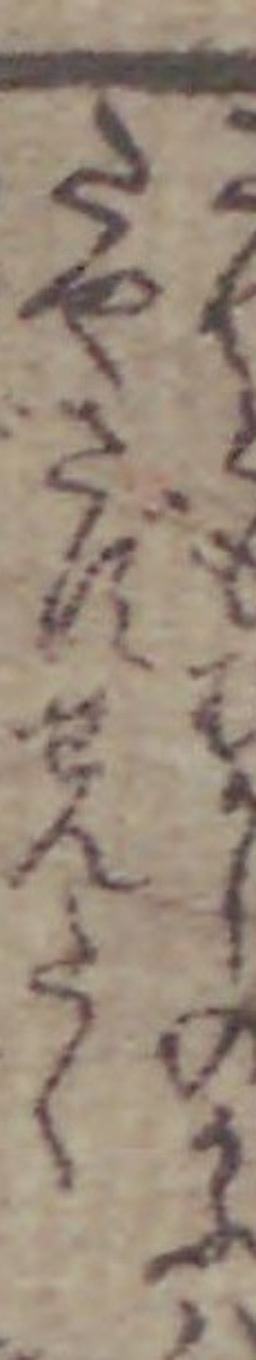たやさずせんたく
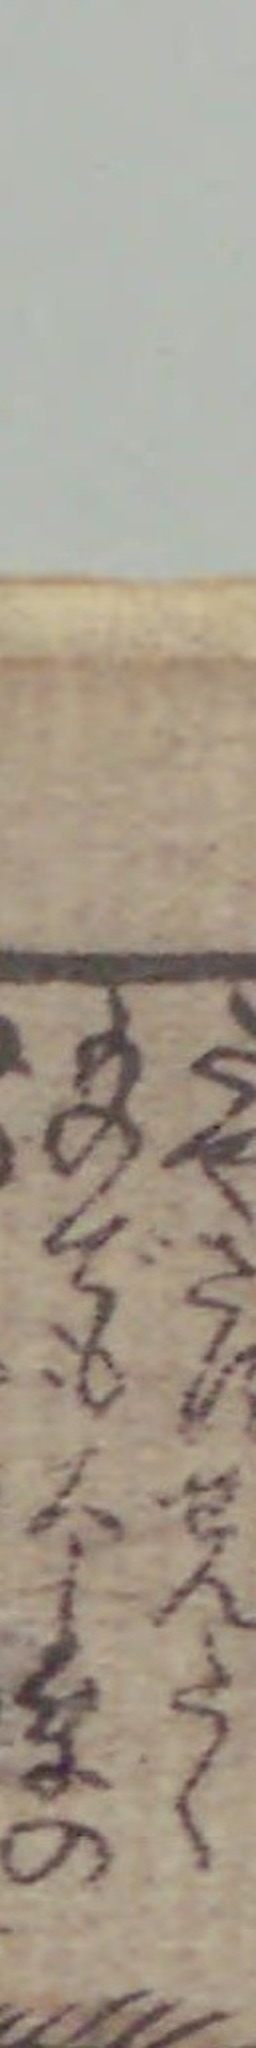ものでも大しまの
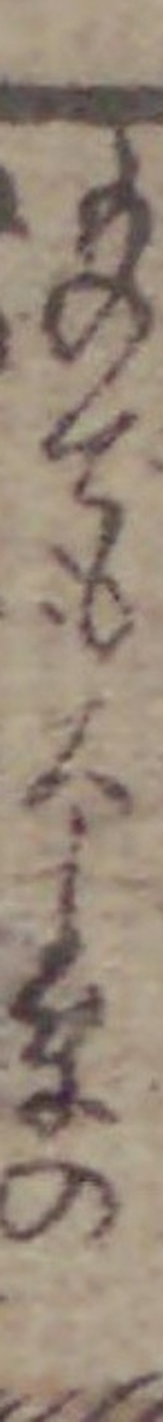ものでも大しまの
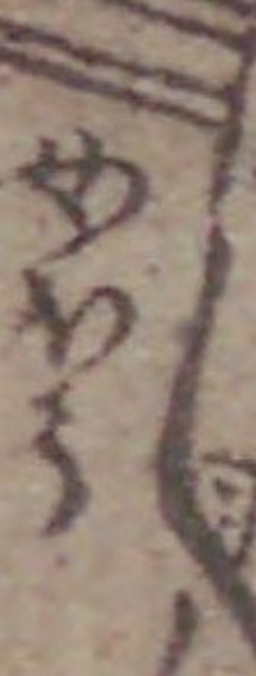女ほう
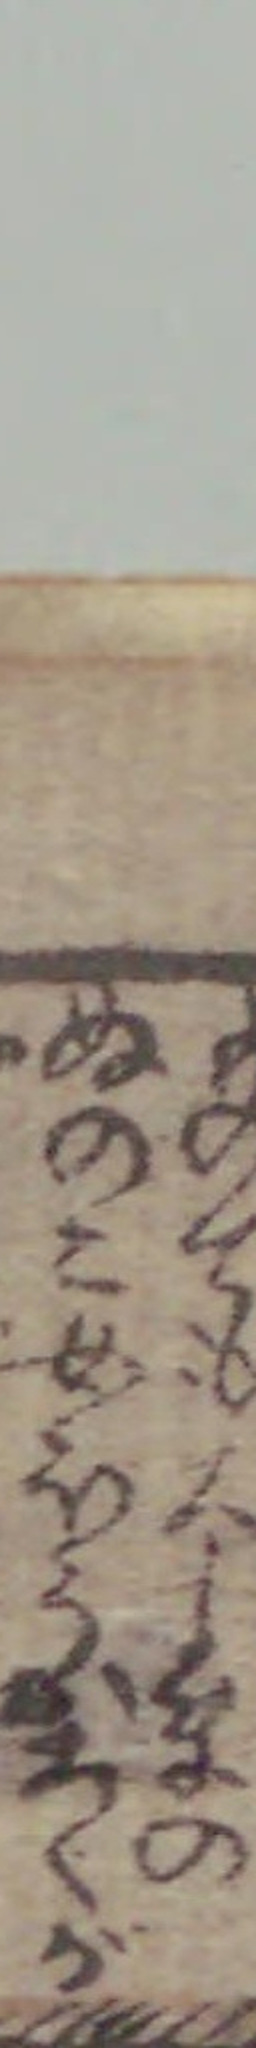ぬのこ女ほうおろくが
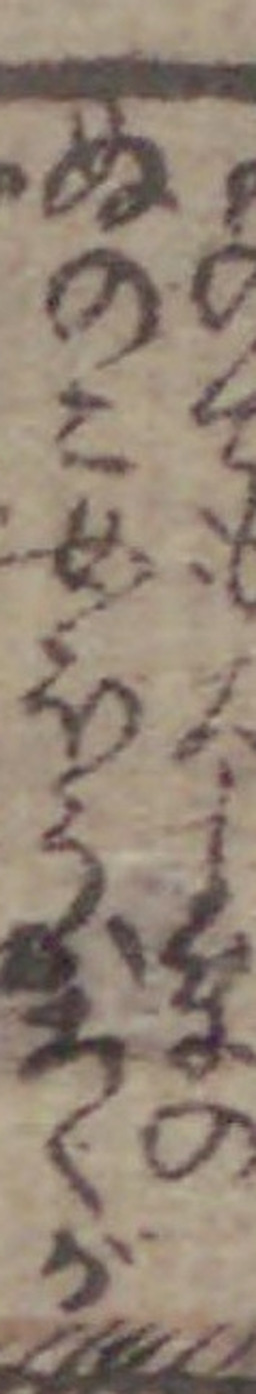ぬのこ女ほうおろくが
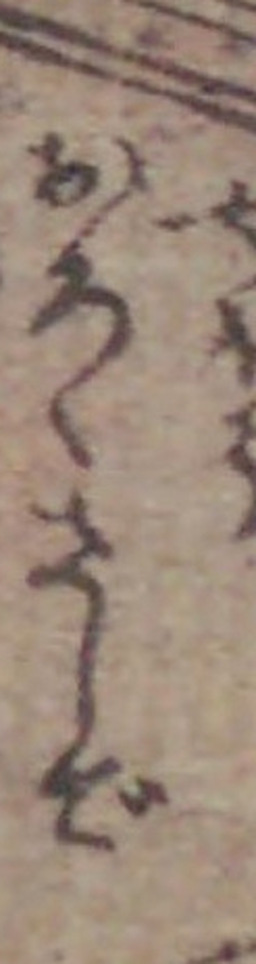おろくさしで
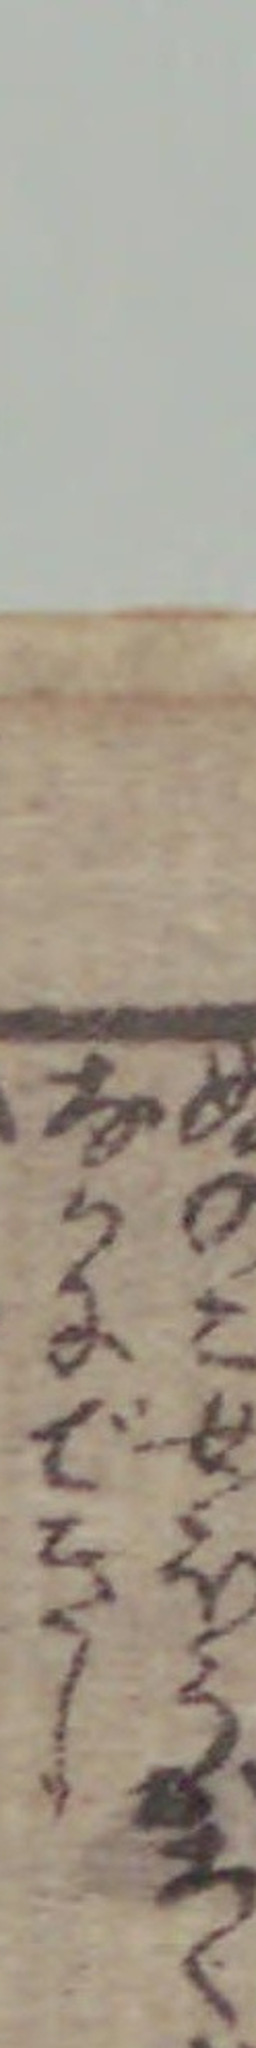なかにできし
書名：化物鼻がひしげ 2巻
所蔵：国立国会図書館 National Diet Library, JAPAN
